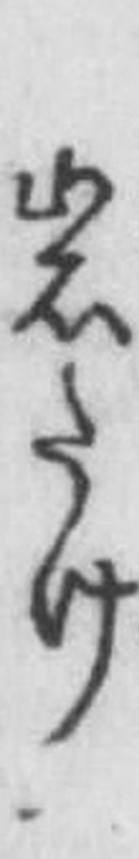岩たけ
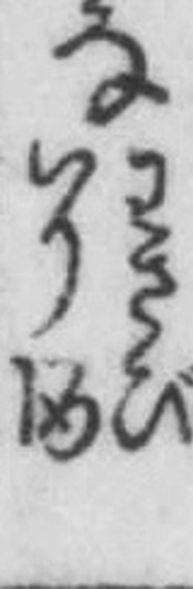いり酒
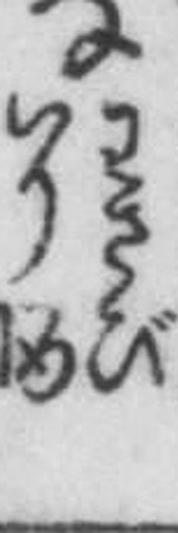いり酒
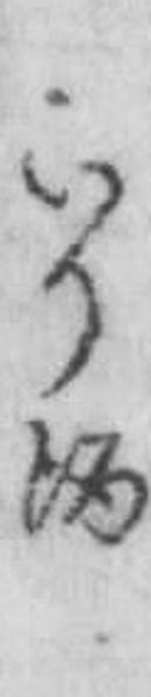いり酒
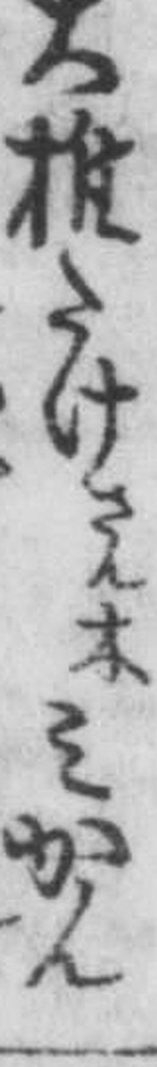大椎たけさん木ミかん
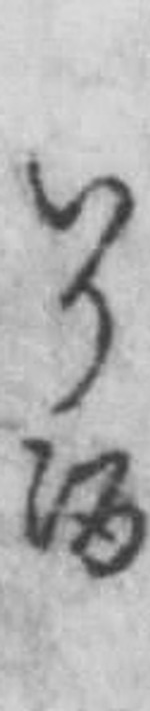いり酒

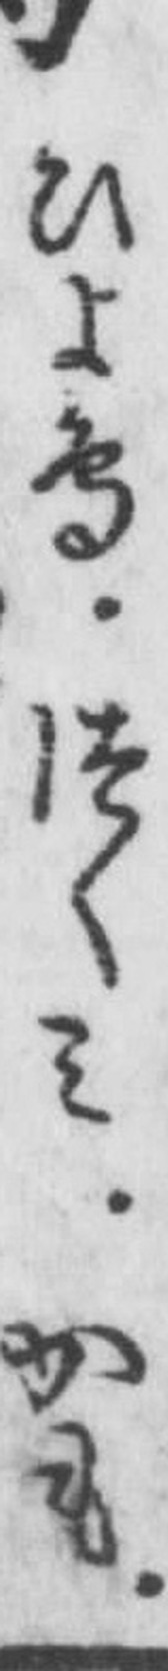時ひよ鳥つくミかも
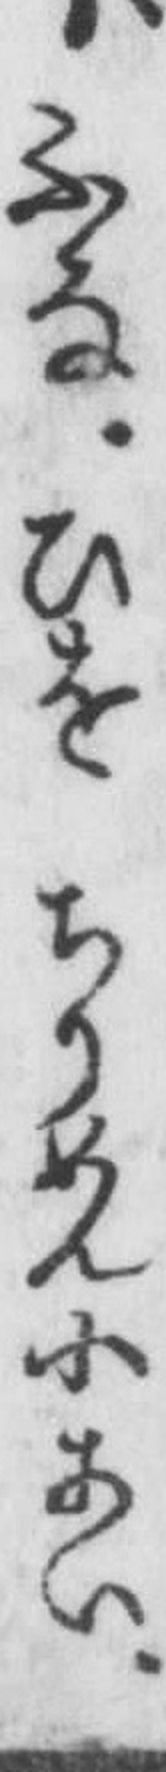ふなひをちりめん小あい
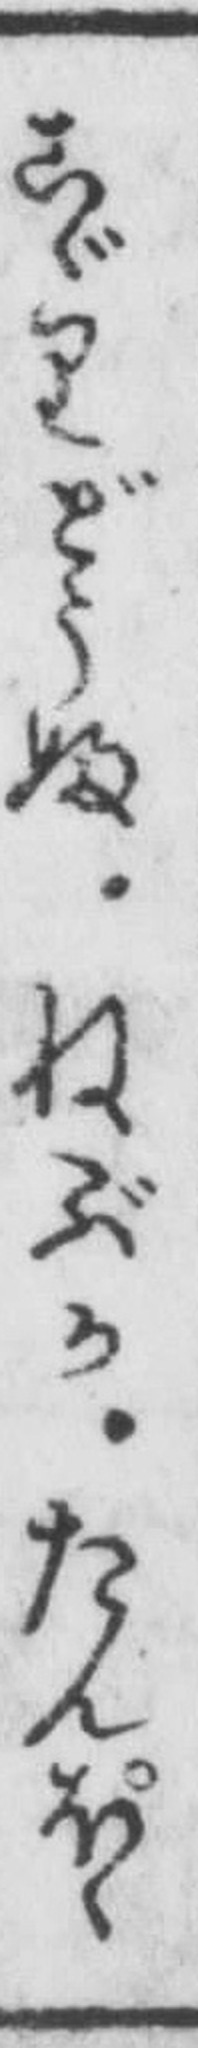しゞりどうふねぶかたんぽゝ
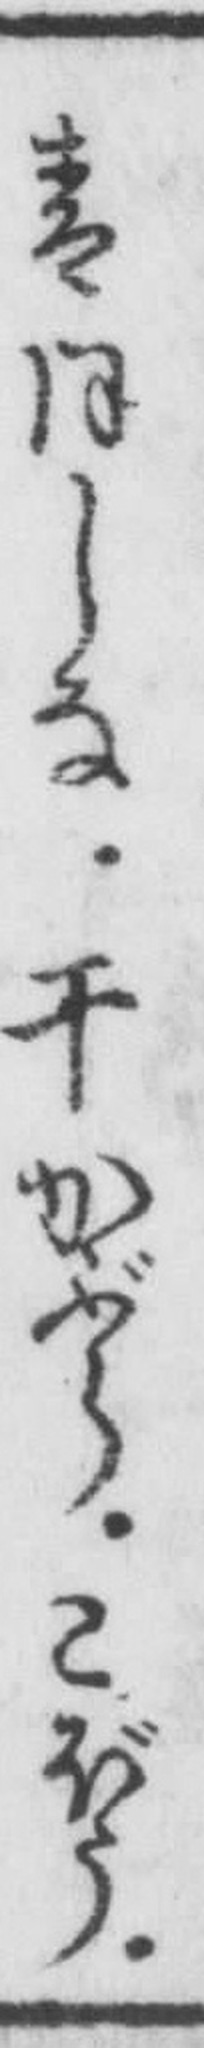青ほしな干しかぶらこぼう
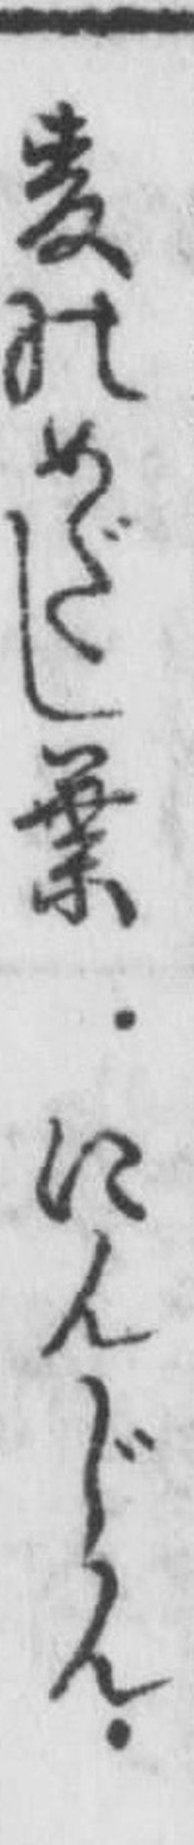青のめだし菜にんじん
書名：当世料理筌
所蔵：大阪府立大学学術情報センター 国文学研究資料館
